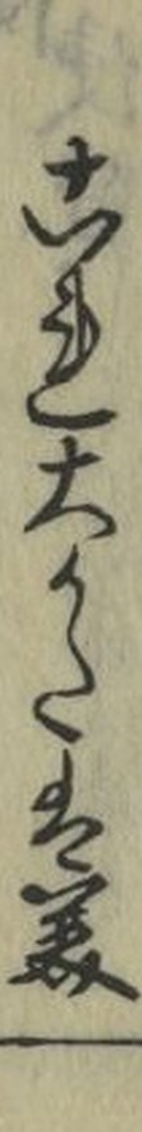これ大かたは美
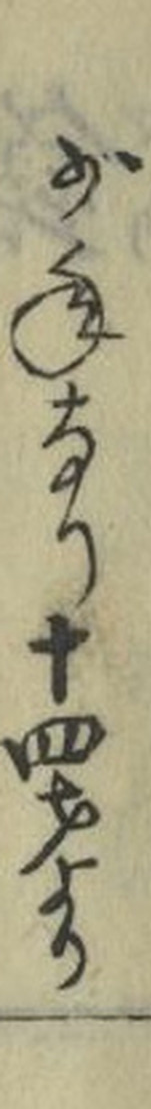少年なり十四才より
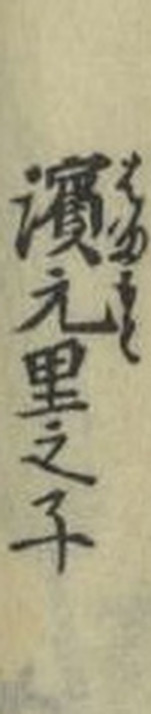登川里之子
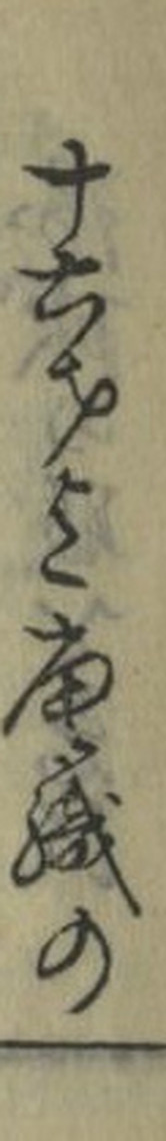十六才は唐織の
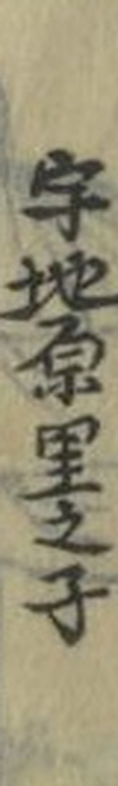宇地原里之子
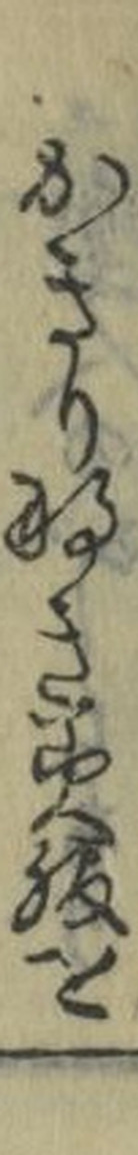かきりなき美服を
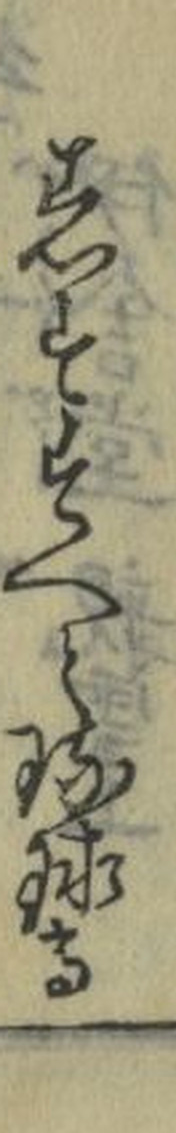着すすへて琉球高
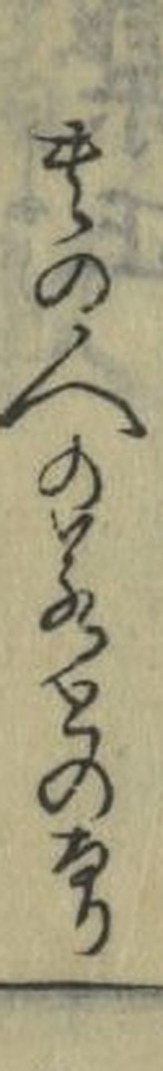貴の人の若とのなり
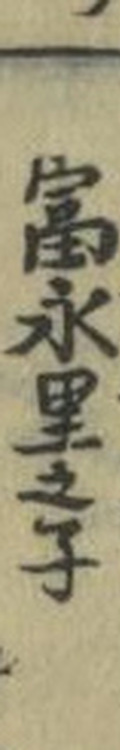富永里之子
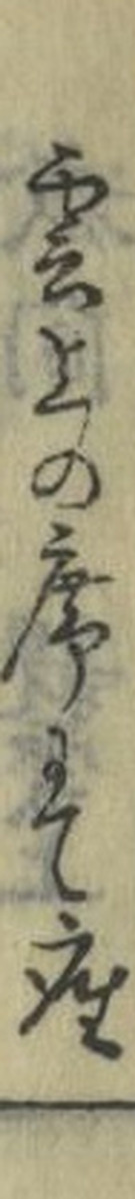雲上の席にて座
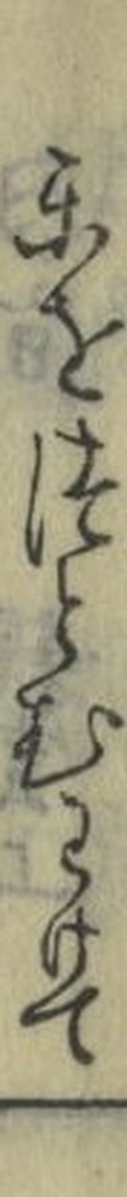楽をつとむわけて
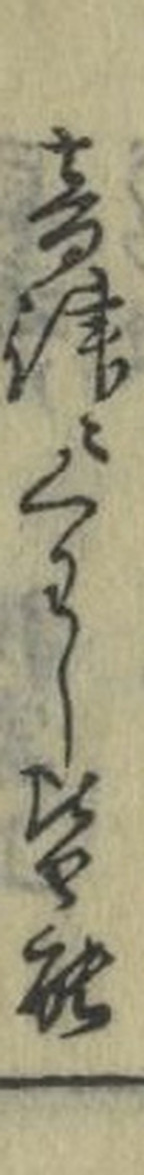音律にくわし皆能
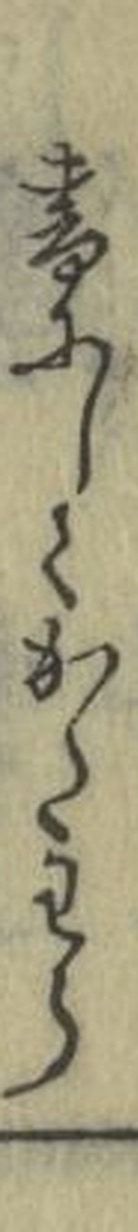書にしてかたわら
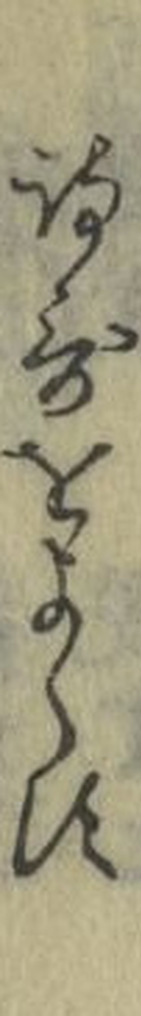詞歌をよらす
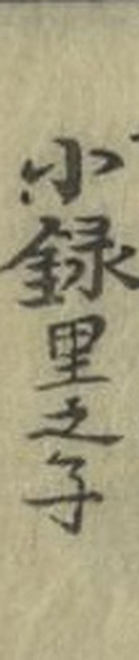小録里之子
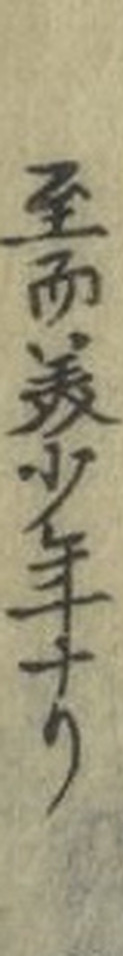至而美少年ナリ
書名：[琉球人行列記]
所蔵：University of the Ryukyus Library
